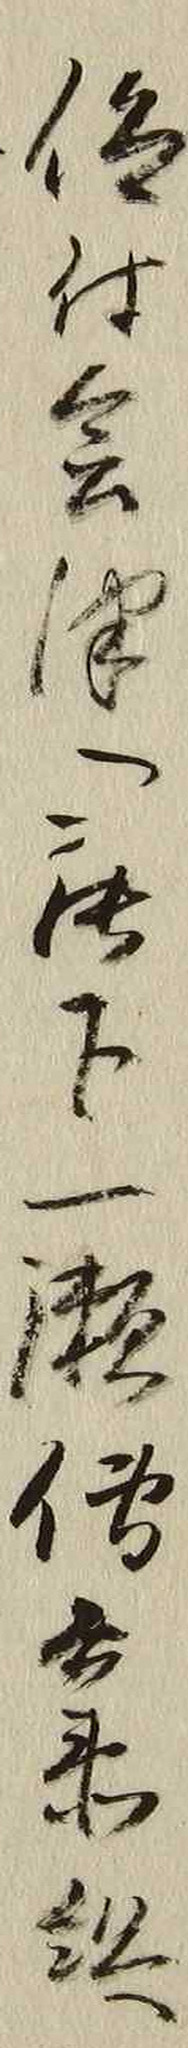仰付会津へ罷下一瀬伝兵衛組へ
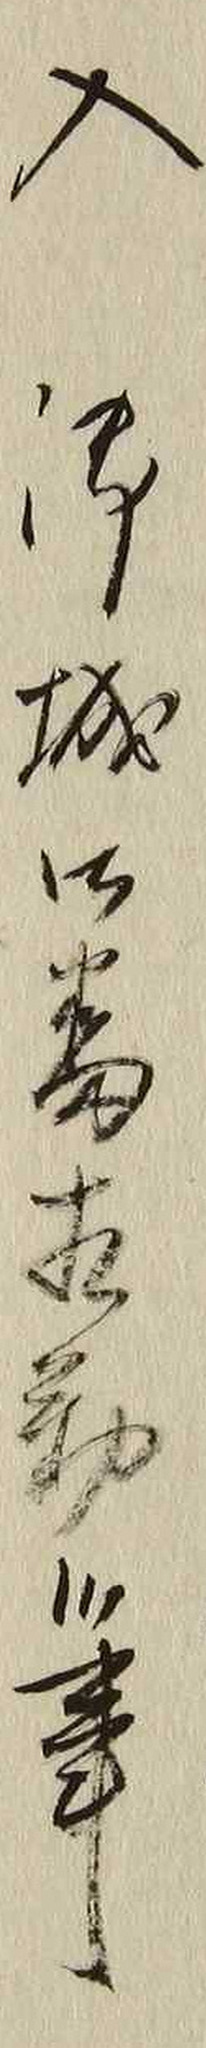入御城御番相勤候事
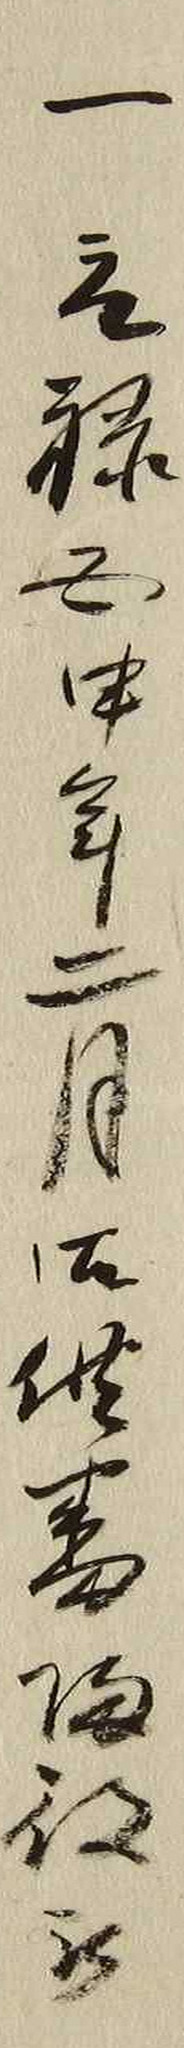一元禄五申年二月御供番帰役被
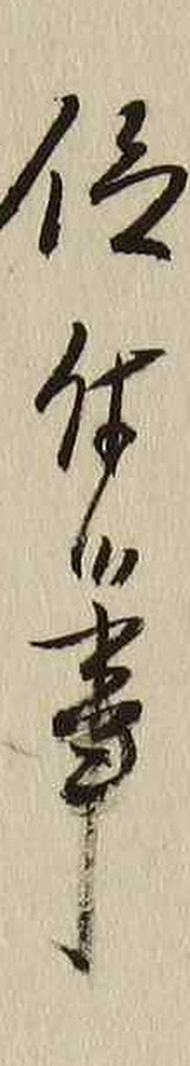仰付候事
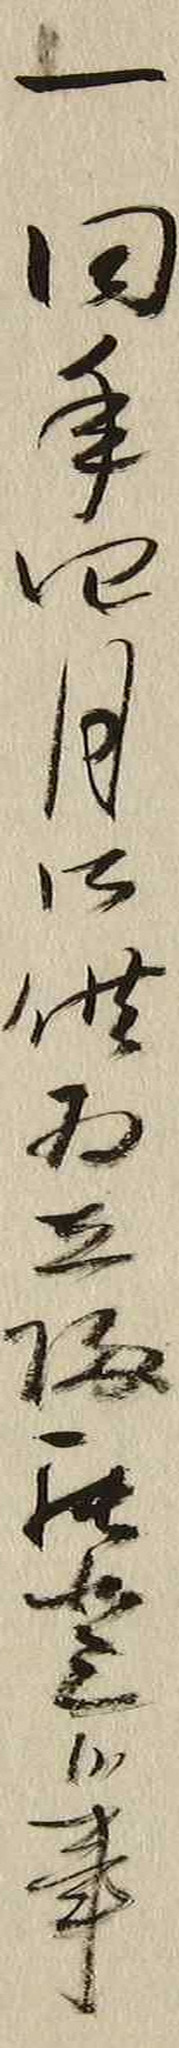一同年四月御供為立帰罷登候事
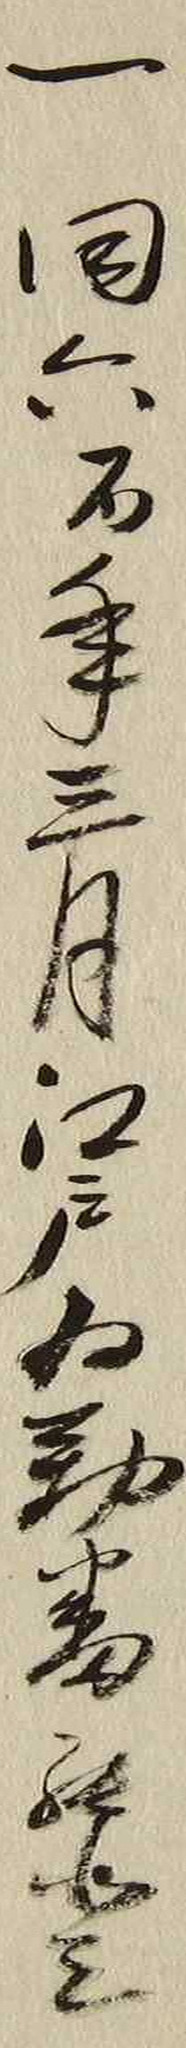一同六酉年三月江戸為勤番罷登
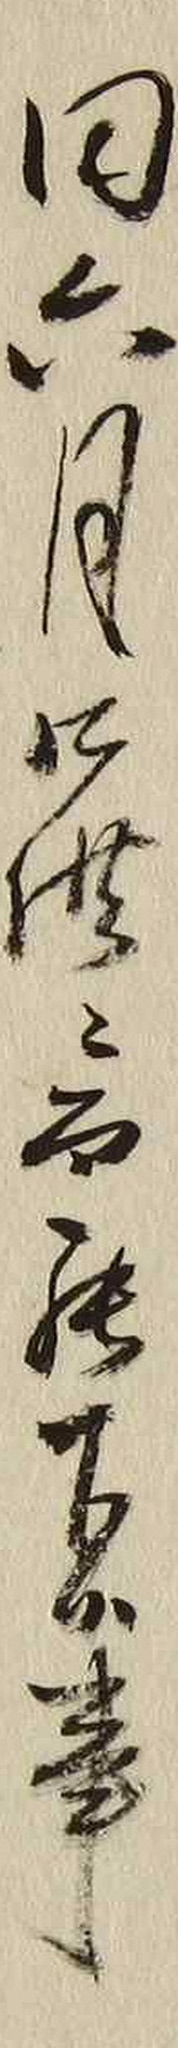同六月御供ニ而罷下候事
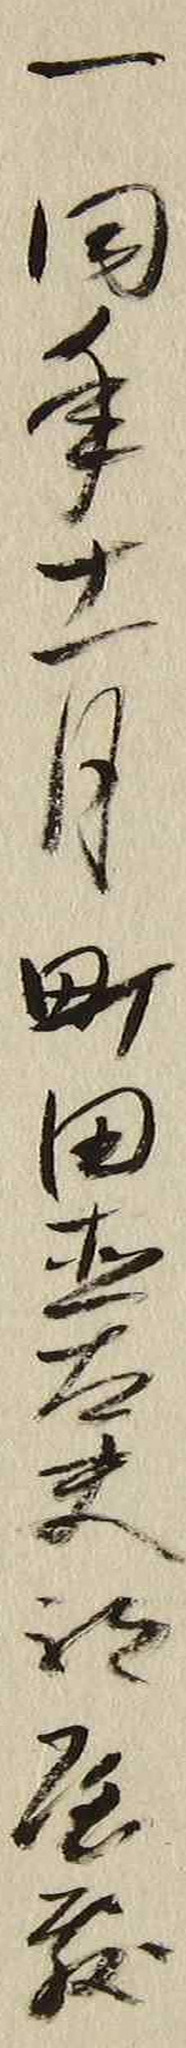一同年十一月町田直太夫跡屋敷
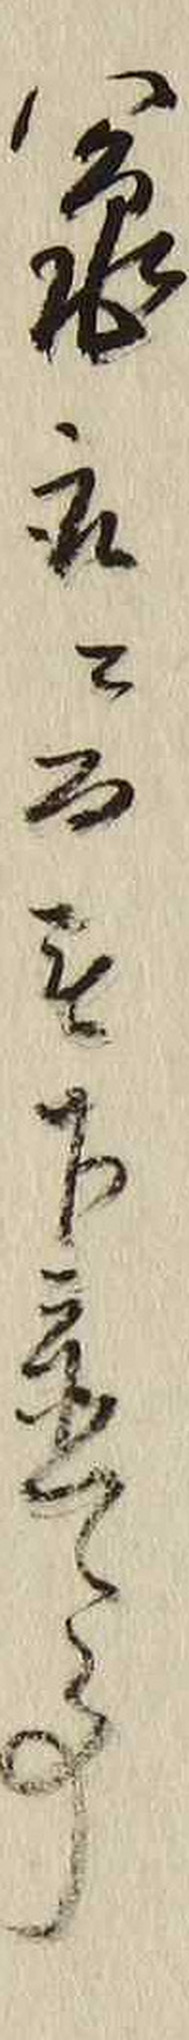竈取ニ而被下置候事
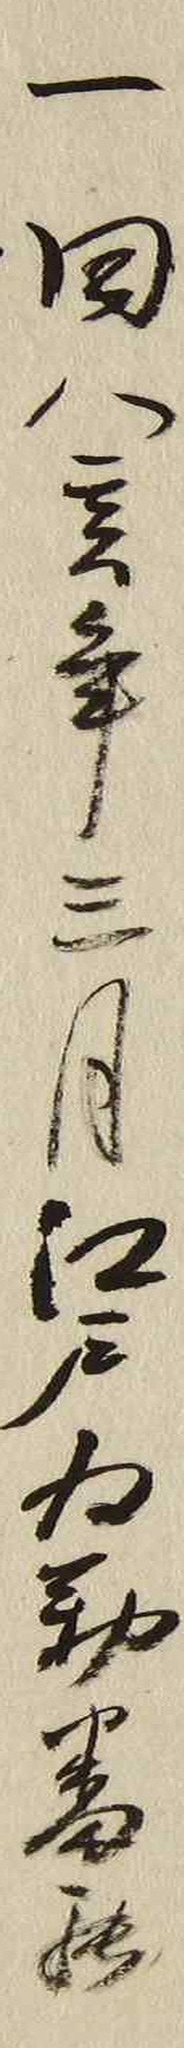一同八亥年三月江戸為勤番罷
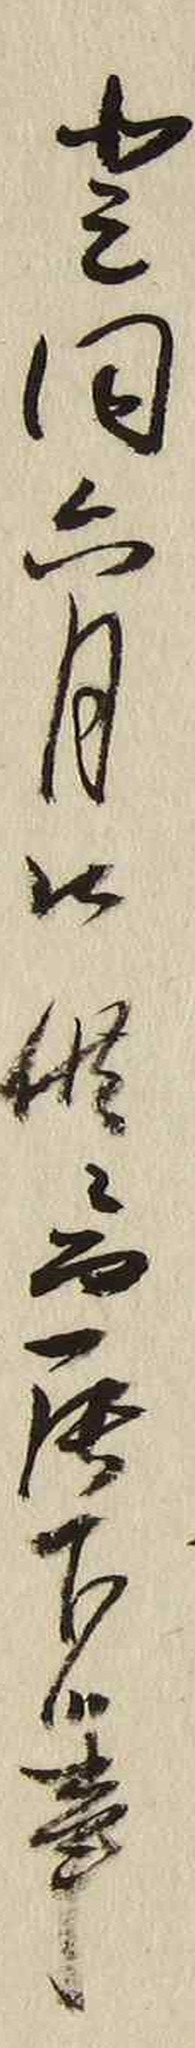登同六月御供ニ而罷下候事
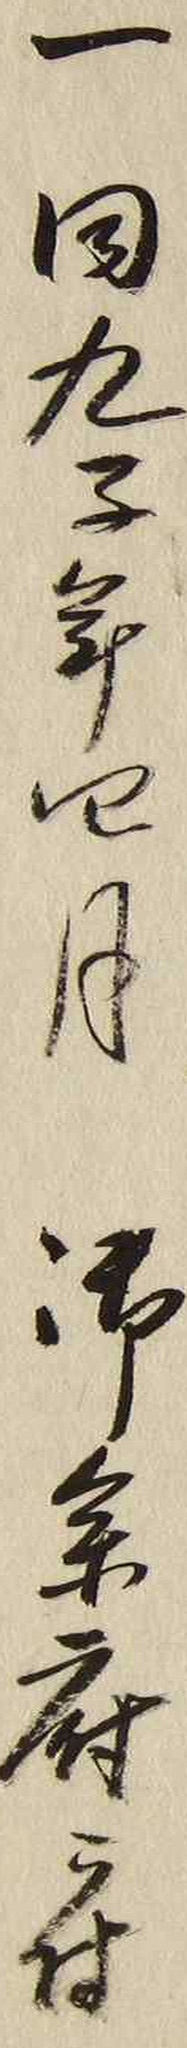一同九子年四月御参府ニ付

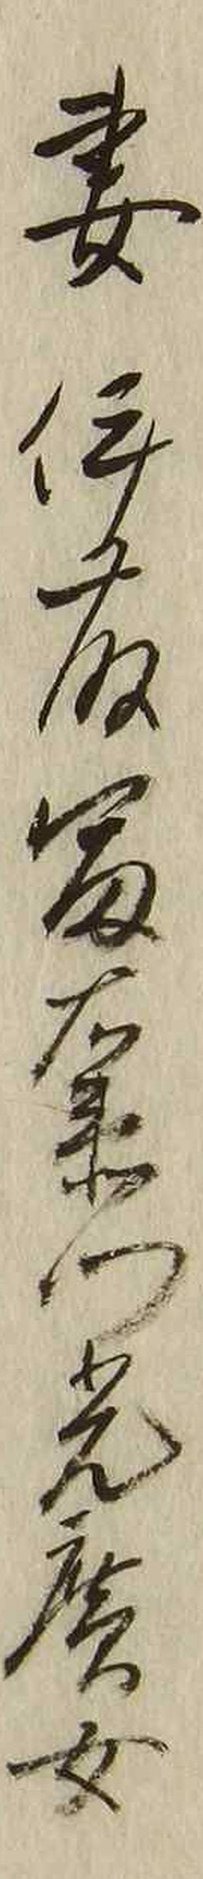妻伊藤富右衛門光広女
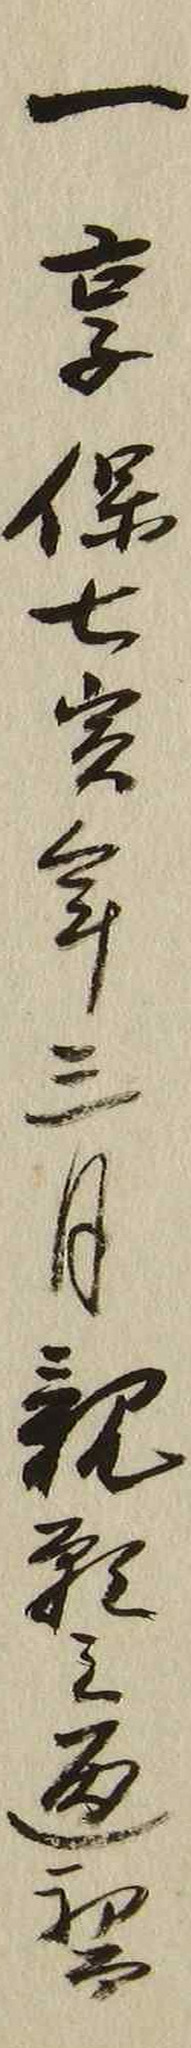一享保七寅年三月親願之通初而
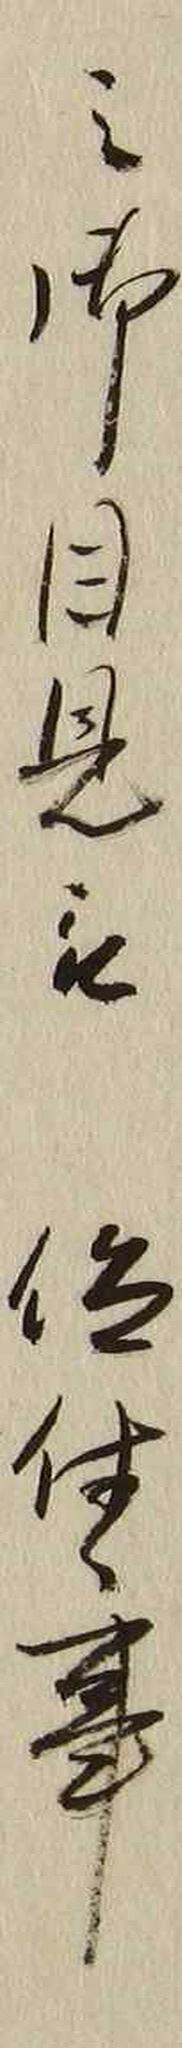之御月見被仰付候事
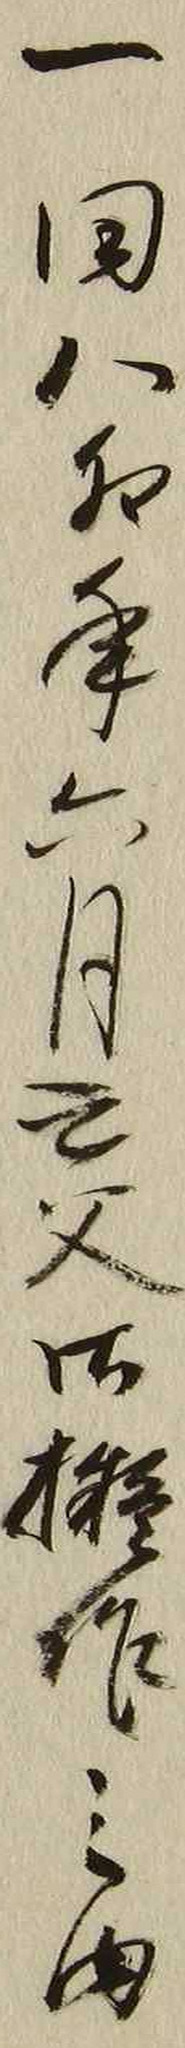一同八卯年六月亡父御擬作之内
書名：諸士系譜　巻之346　も之部2
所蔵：会津若松市立会津図書館
